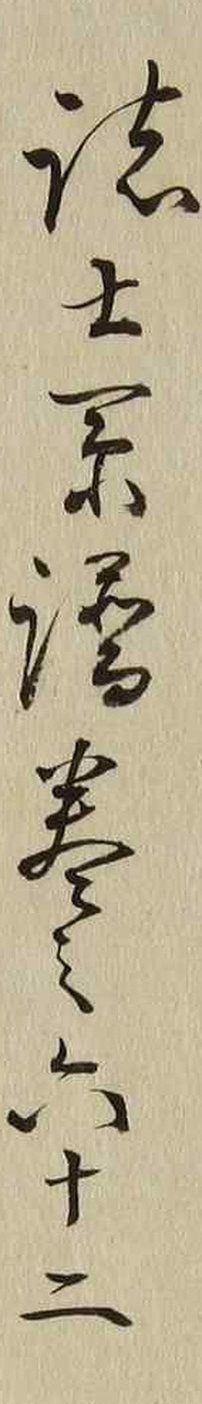諸士系譜巻之六十二
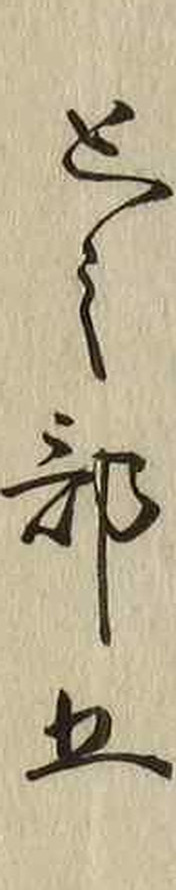と之部五
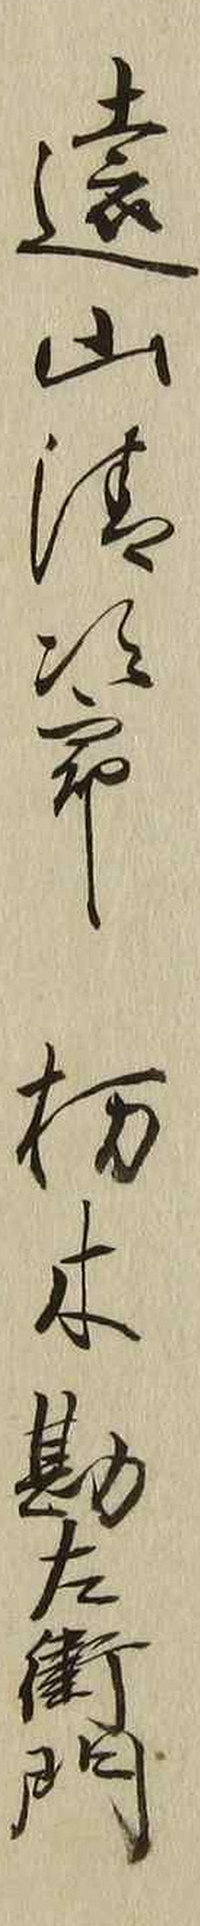遠山清次郎栃木勘左衝門
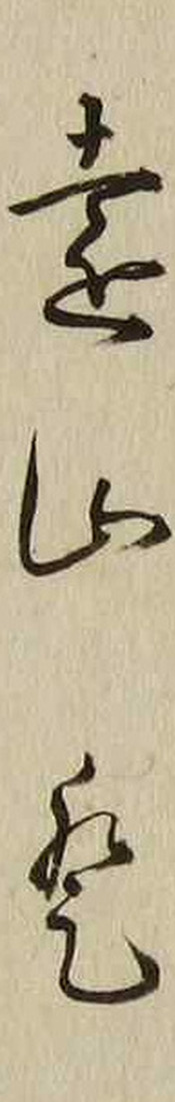遠山登
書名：諸士系譜　巻之62　と之部5
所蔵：会津若松市立会津図書館
